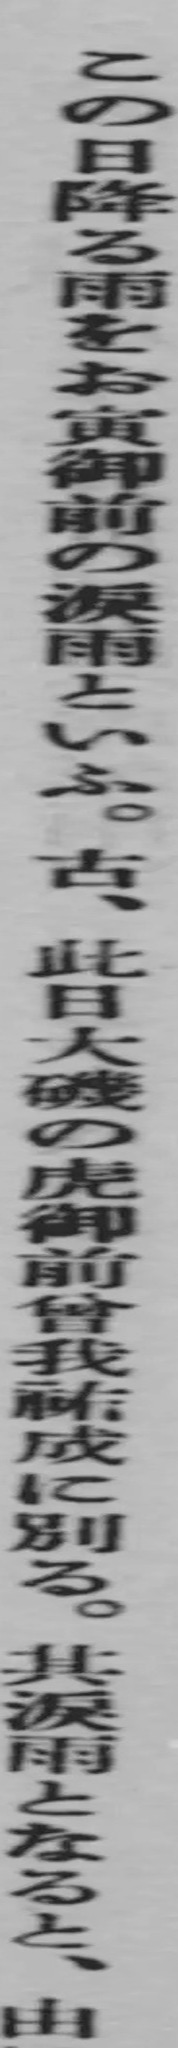この日降る雨をお寅御前の涙雨といふ。古、此日大磯の虎御前曾我祐成に別る。其涙雨となると、由に
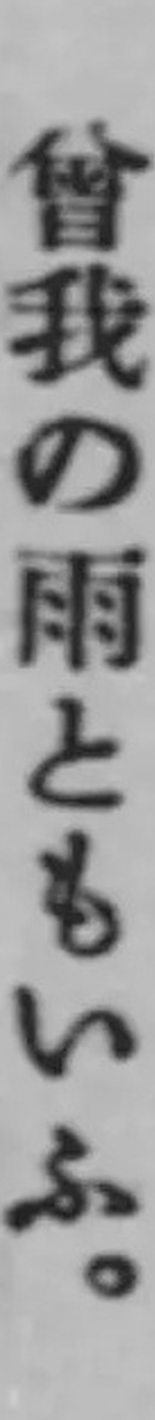曾我の雨ともいふ。
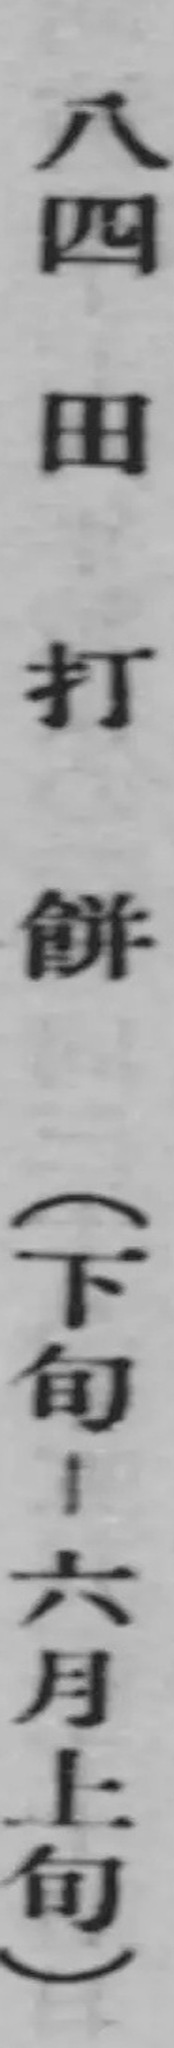八四田打餅(下旬－六月上旬)
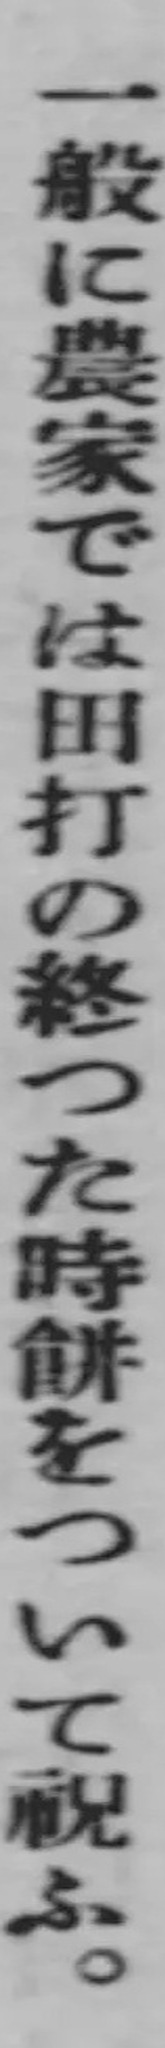一般に農家では田打の終つた時餅をついて祝ふ。
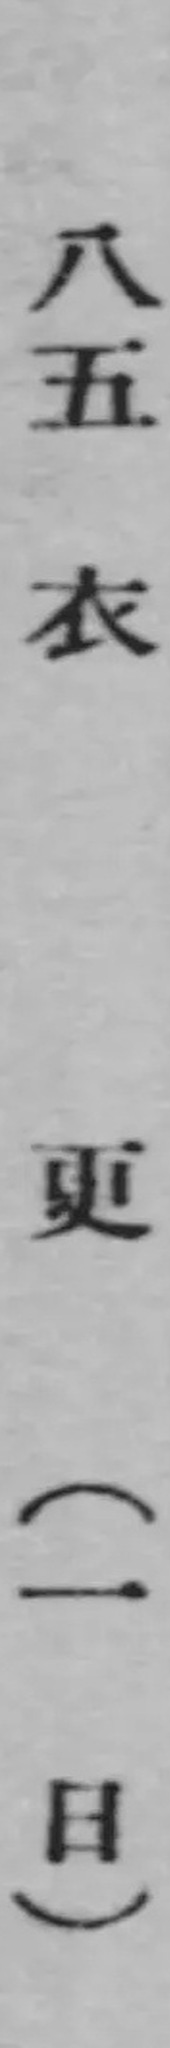八五衣更(一日)
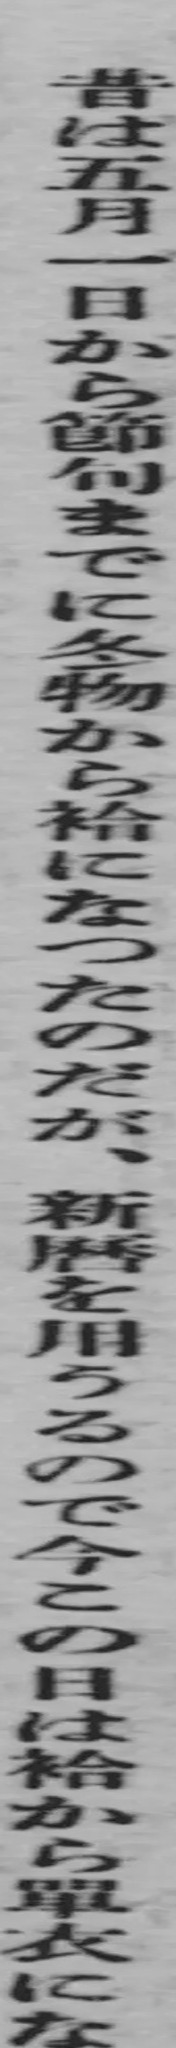昔は五月一日から節句までに冬物から袷になつたのだが、新曆を用うるので今この日は袷から單衣にな
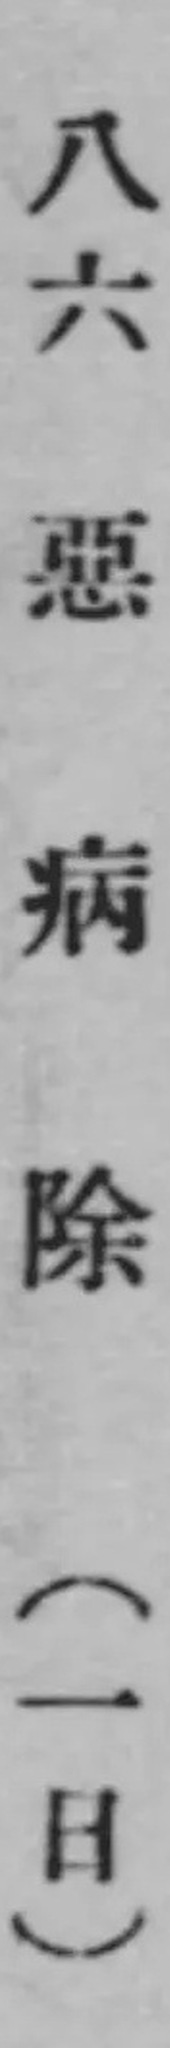八六惡病除(一日)
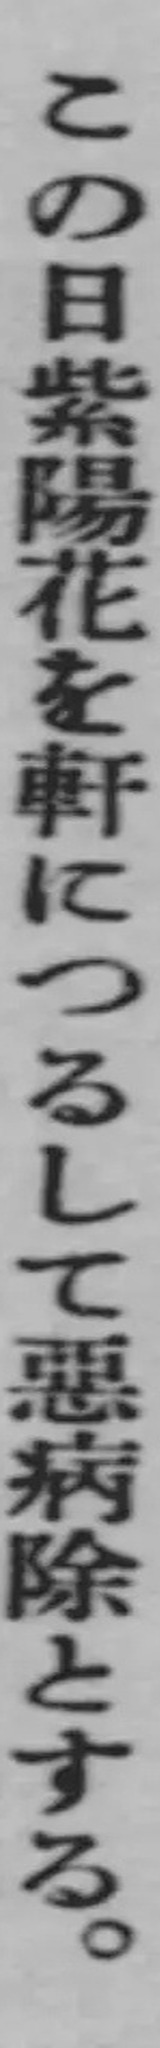この日紫陽花を軒につるして惡病除とする。
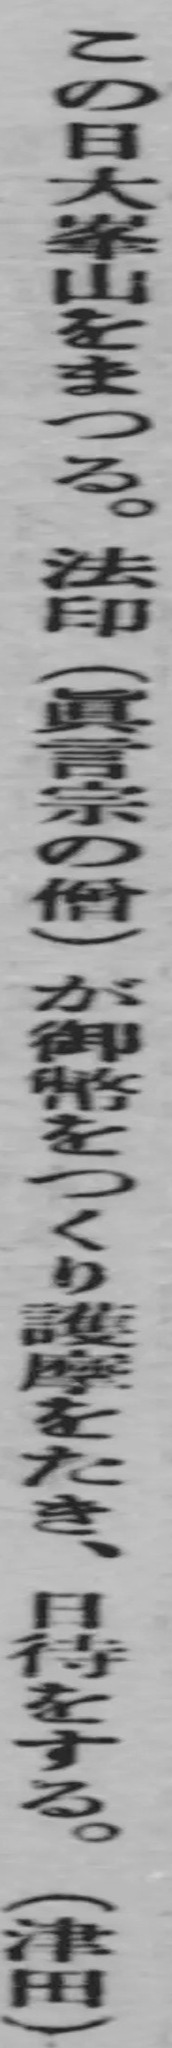この日大峯山をまつる。法印(眞言宗の僧)が御幣をつくり護摩をたき、日待をする。(津田)
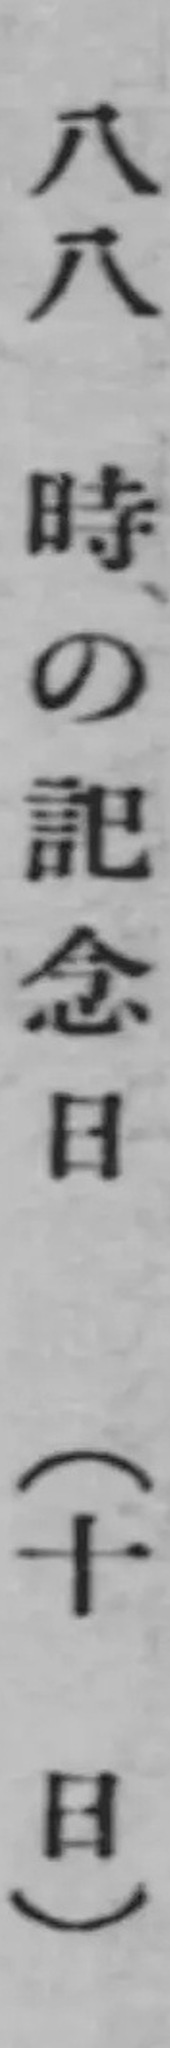八八時の記念日(十日)
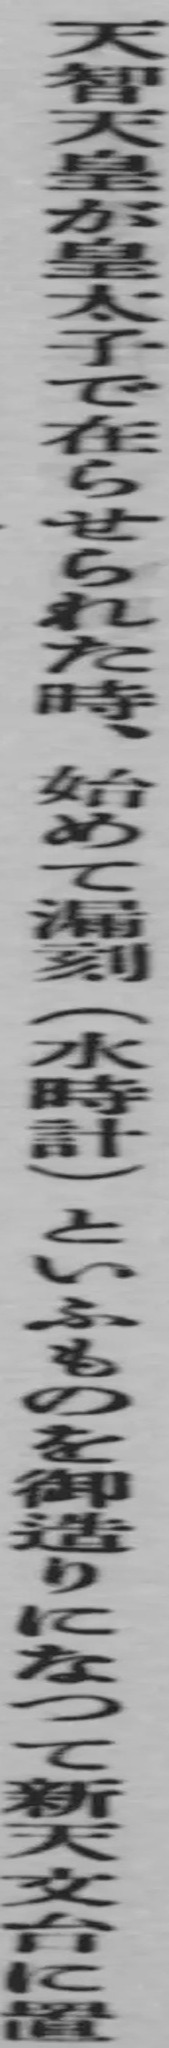天智天皇が皇太子で在らせられた時、始めて漏刻(水時計)といふものを御造りになつて新天文台に置
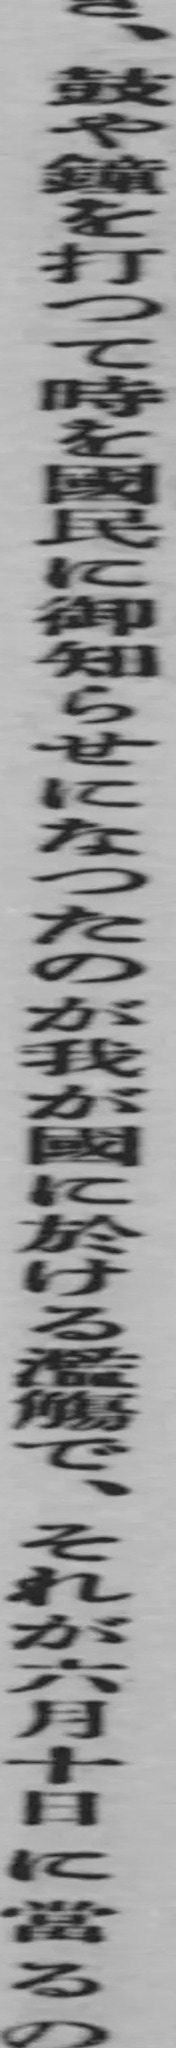き、鼓や鐘を打つて時を國民に御知らせになつたのが我が國に於ける濫觴で、それが六月十日に當るの
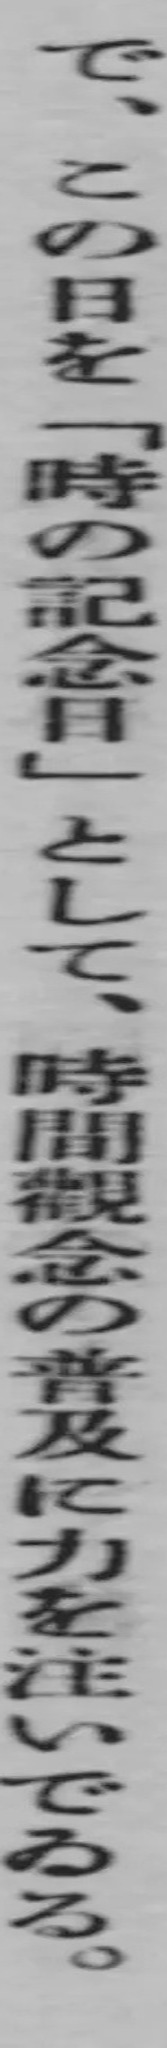で、この日を「時の記念日」として、時間觀念の普及に力を注いでゐる。

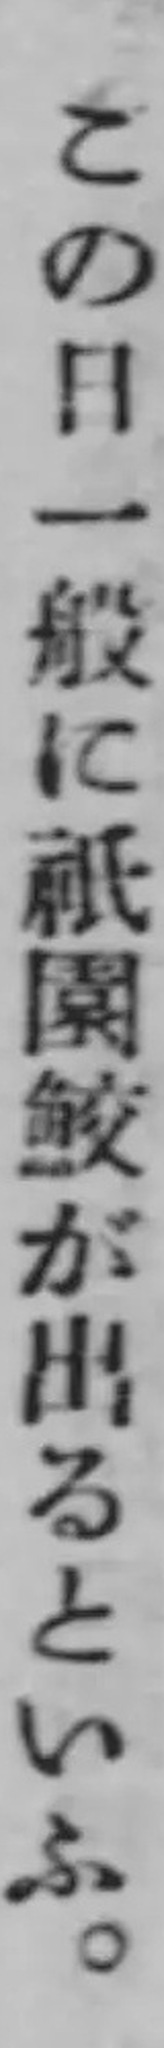この日一般に祇園鮫が出るといふ。
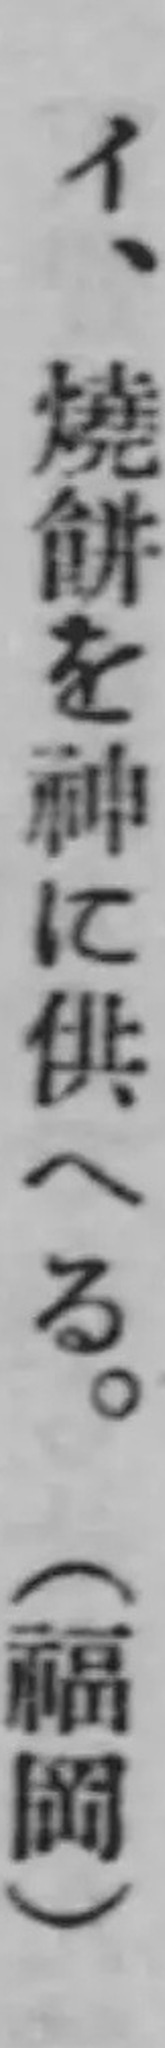イ、燒餅を神に供へる。(福岡)
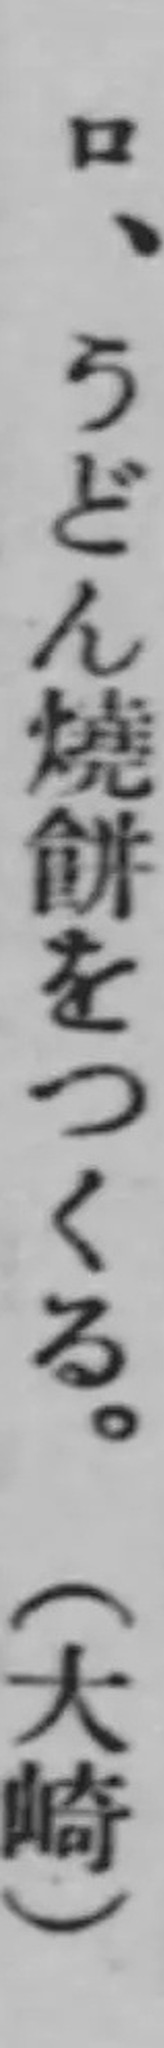ロ、うどん燒餅をつくる。(大崎)
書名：豊橋の年中行事
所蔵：国立国会図書館 National Diet Library, JAPAN
